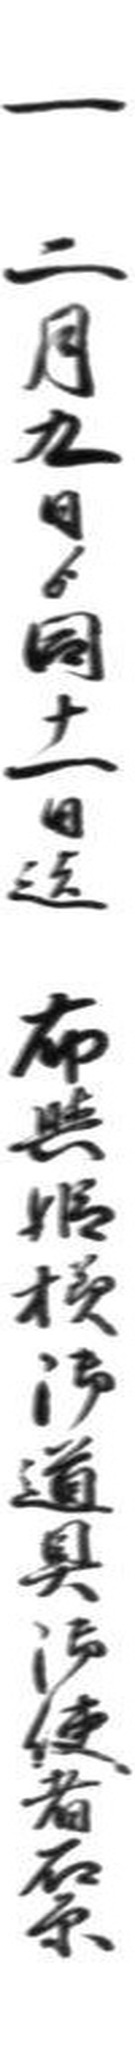一二月九日ゟ同十一日迄布与姫様御道具御使者石原
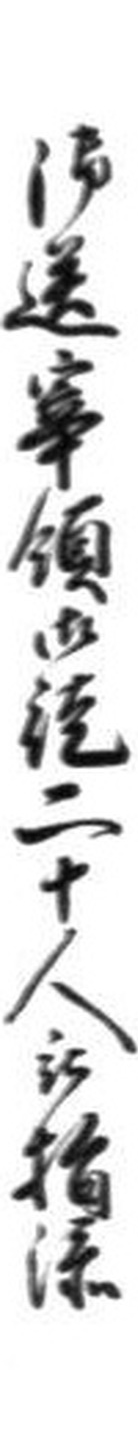御送宰領御徒二十人被指添
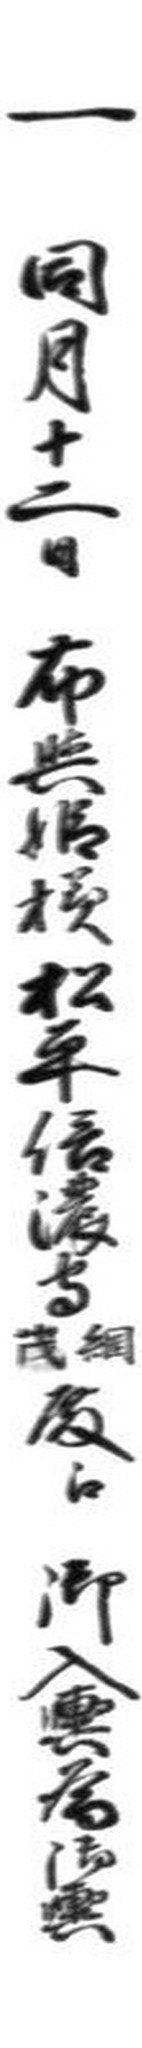一同月十二日布与姫様松平信濃守綱茂殿江御入輿為御輿

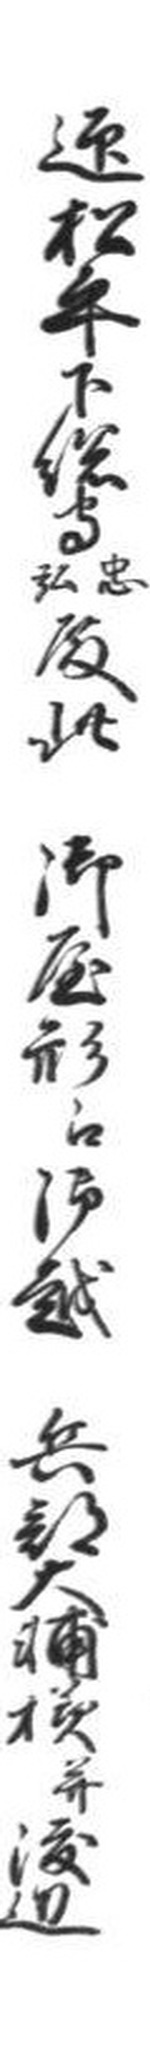迎松平下総守忠弘殿此御屋形江御越兵部大輔様并渡辺
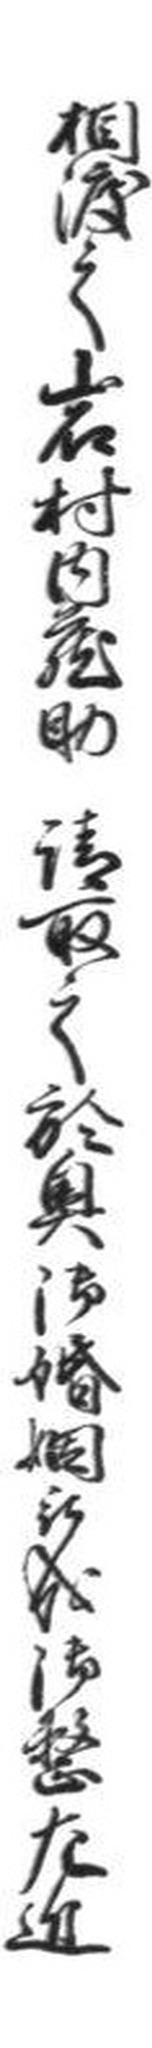相渡之岩村内蔵助請取之於奥御婚姻被成御整左近
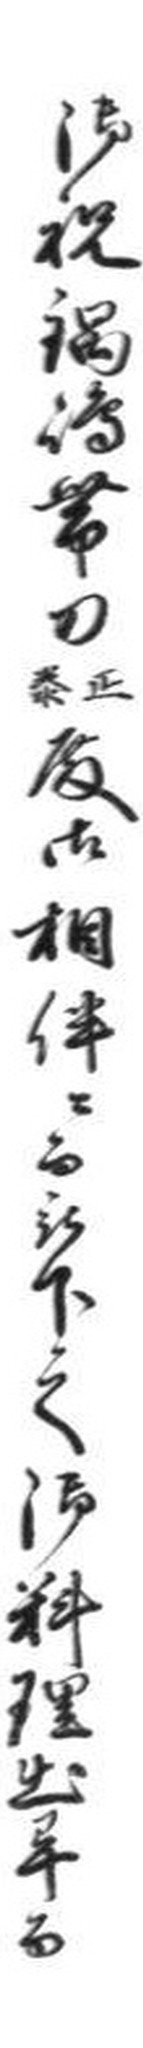御祝鍋嶋帯刀正泰殿御相伴ニ而被下之御料理出畢而
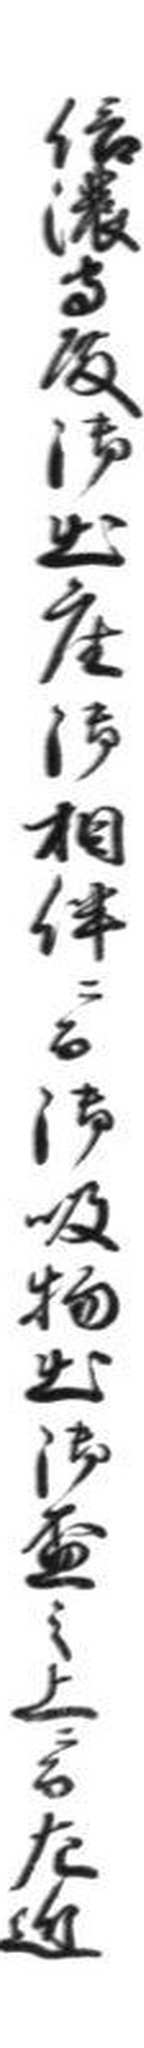信濃守殿御出座御相伴ニ而御吸物出御盃之上ニ而左近
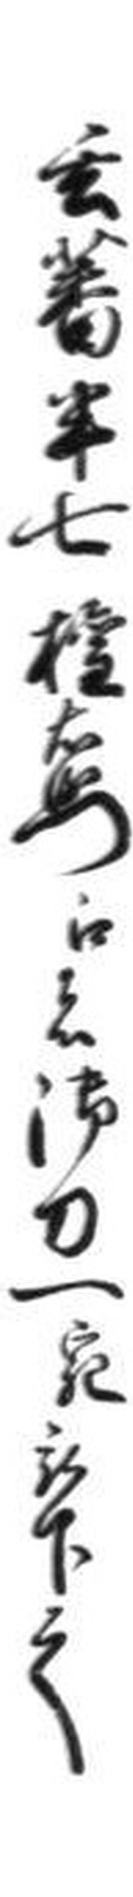玄蕃半七権右衛門江者御刀一宛被下之
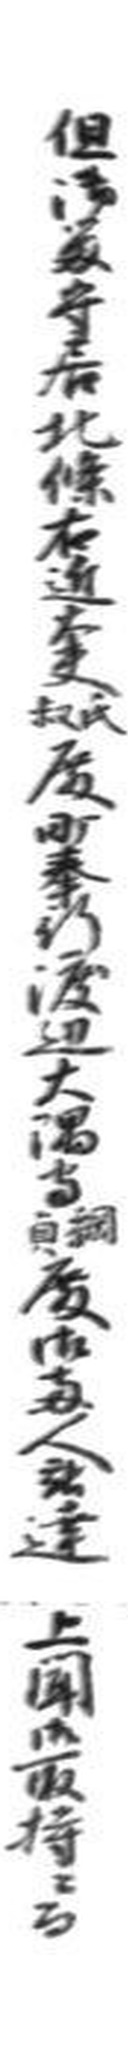但御留守居北条右近大夫氏叔殿町奉行渡辺大隅守綱貞殿御両人被達上聞御取持ニ而
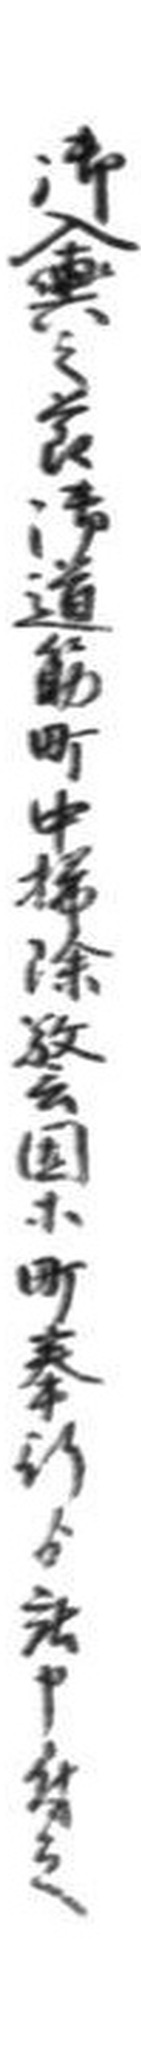御入輿之節御道筋町中掃除警固等町奉行ゟ被申付之
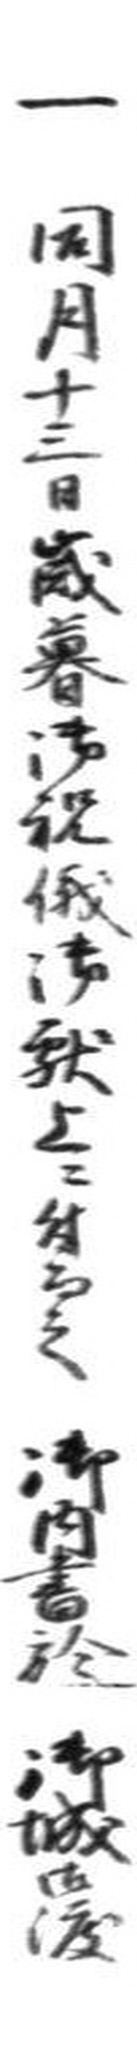一同月十三日歳暮御祝儀御献上ニ付而之御内書於御城御渡
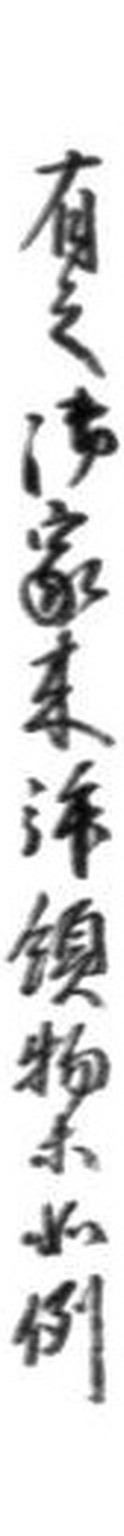有之御家来拝領物等如例
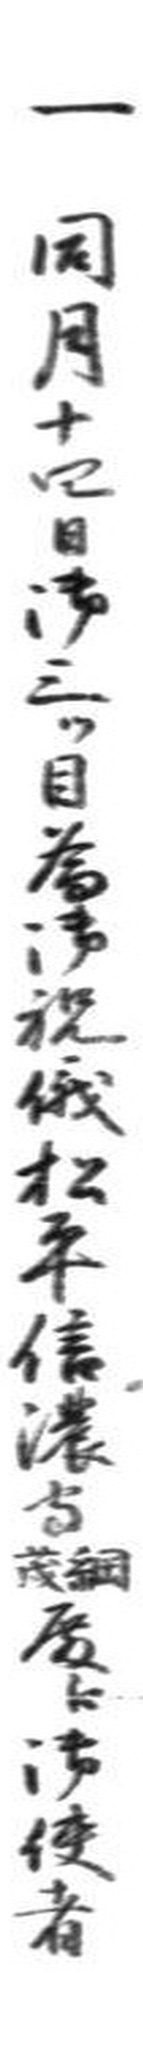一同月十四日御三ツ目為御祝儀松平信濃守綱茂殿江御使者
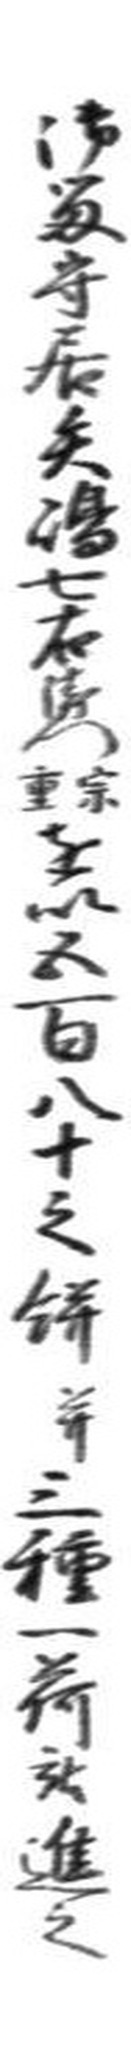御留守居矢嶋七右衛門宗重を以五百八十之餅并三種一荷被進之
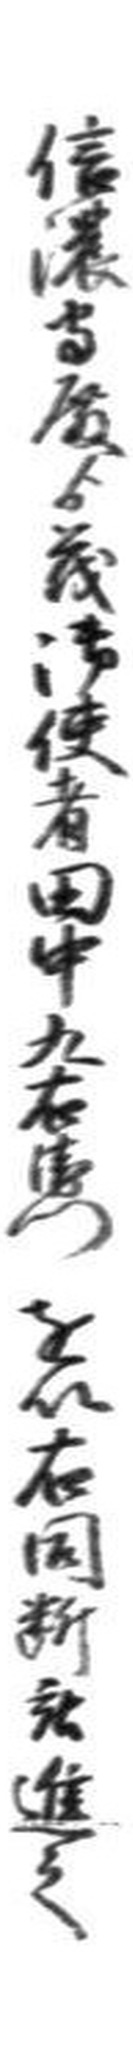信濃守殿ゟも御使者田中九右衛門を以右同断被進之
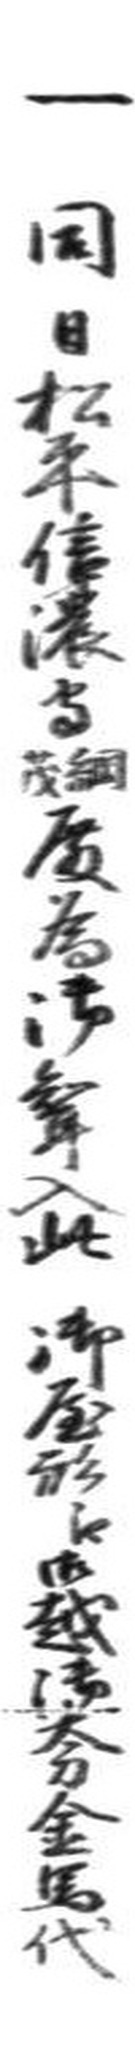一同日松平信濃守綱茂殿為御聟入此御屋形江御越御太刀金馬代
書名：家譜 八 光通公 従寛文十年到同十二年
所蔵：福井県文書館 Fukui Prefectural Archives
